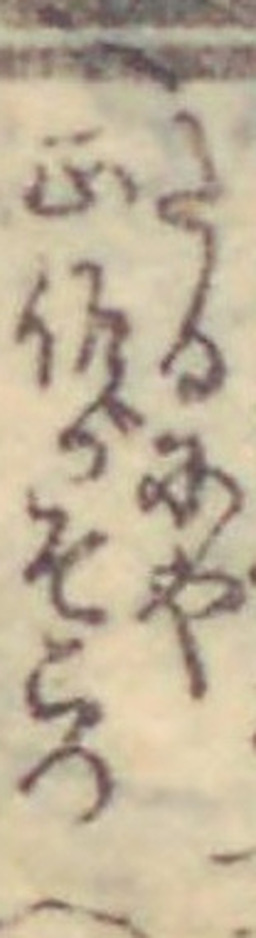正作がそこつ
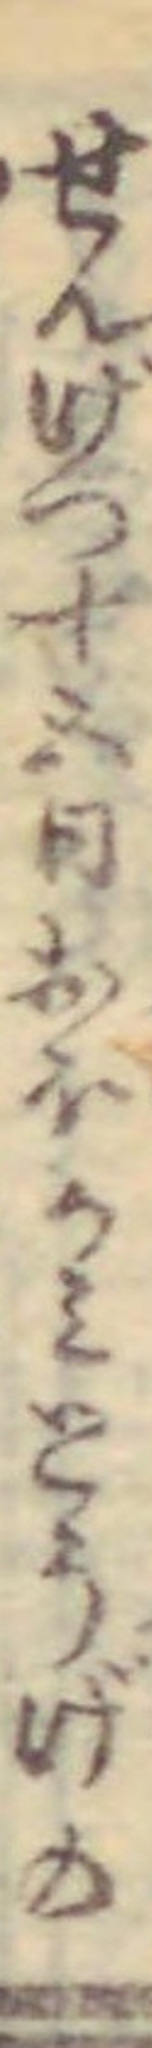せんげつ十五日おほかみとうげの
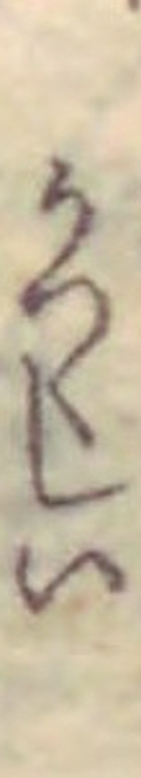うつくしい
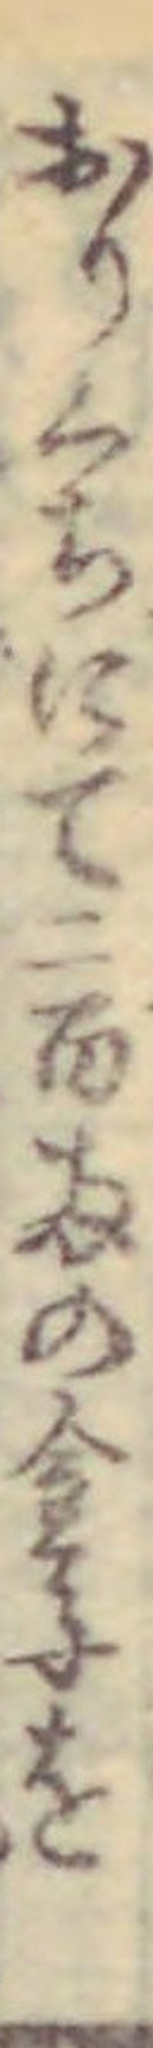おりくちにて二百両の金子を
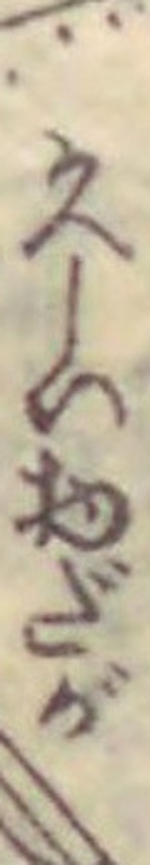久しい物だが
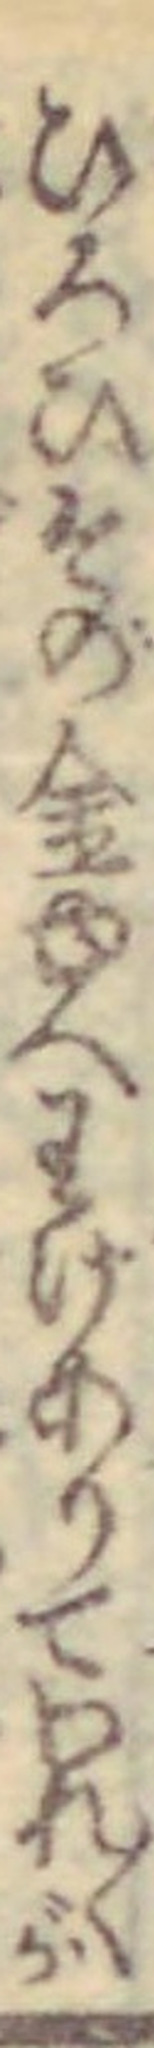ひろひその金ゆへわけありてわれ〳〵が
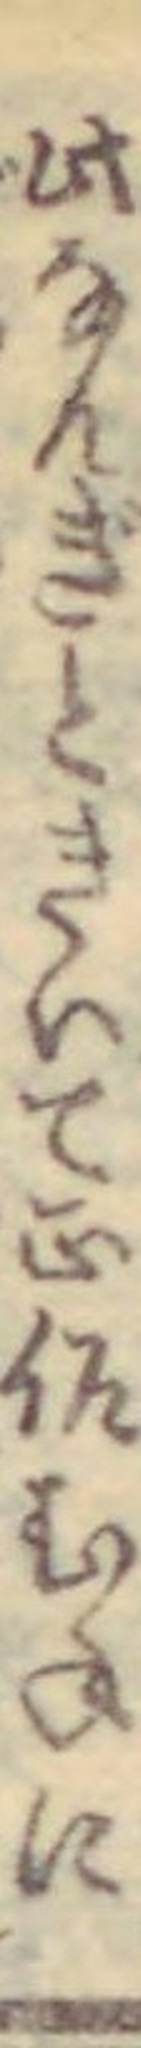此なんぎときいて正作むねに
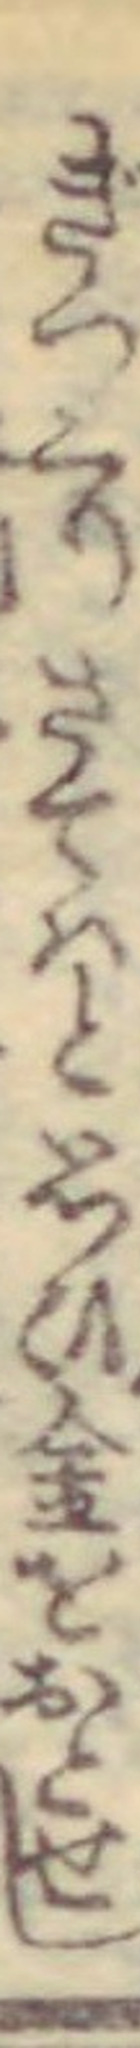ぎつくりさてはと思ひ金をおとせし
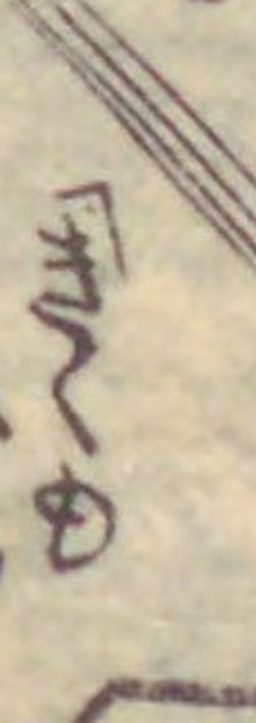〽きくも
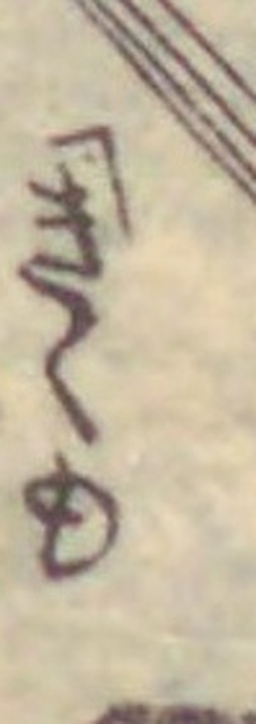〽きくも
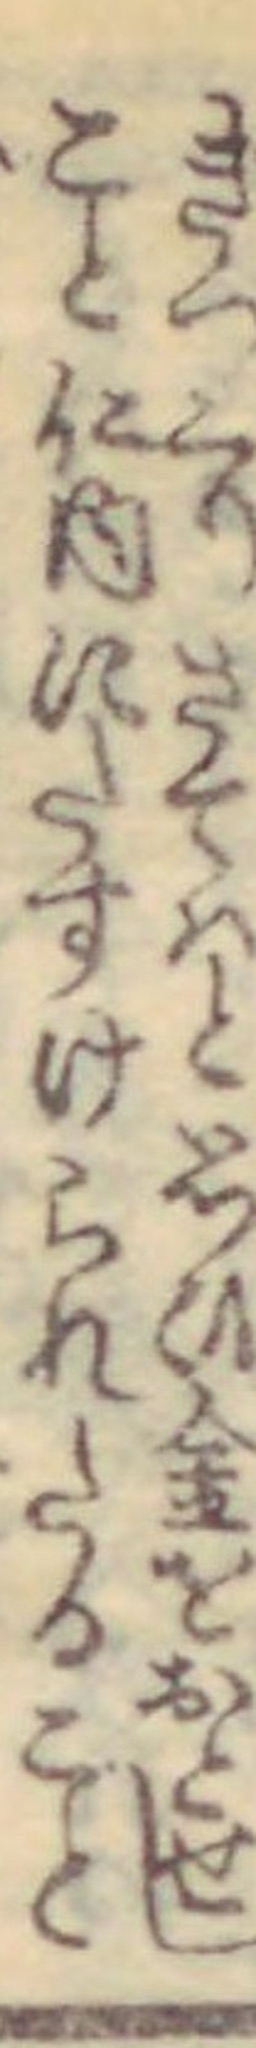こと仁内にたすけられたること
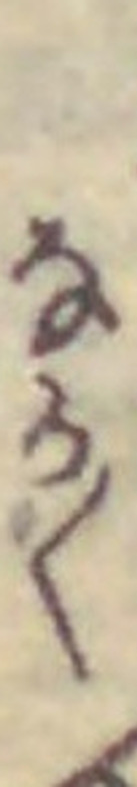なか〳〵
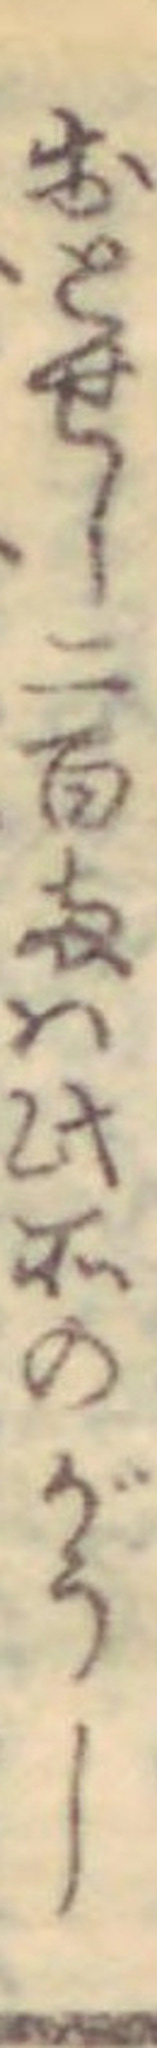おとせし二百両は此所のがうし
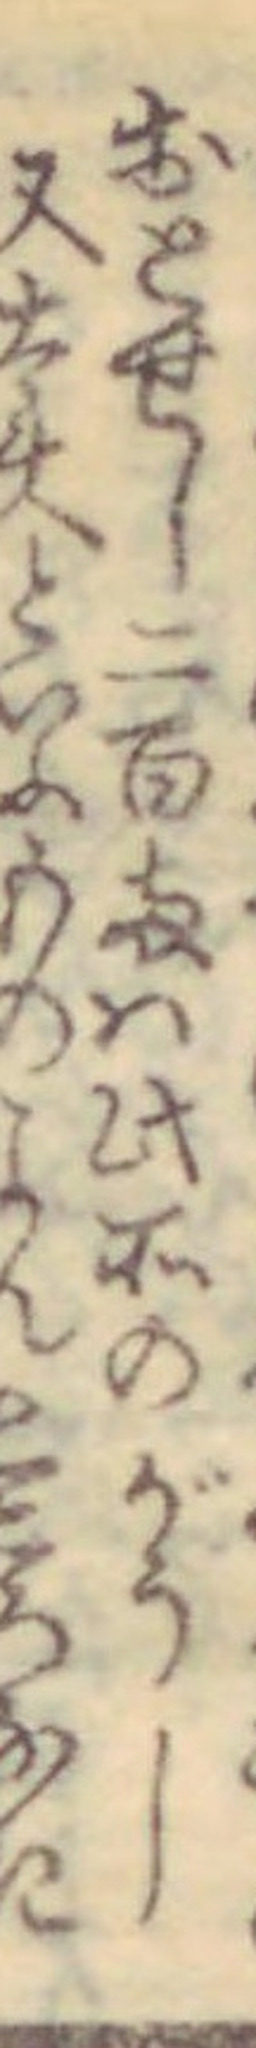又太夫といふものよんところなき
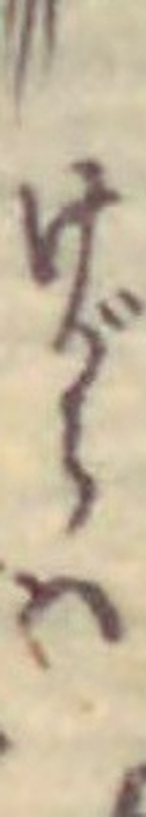けがらは
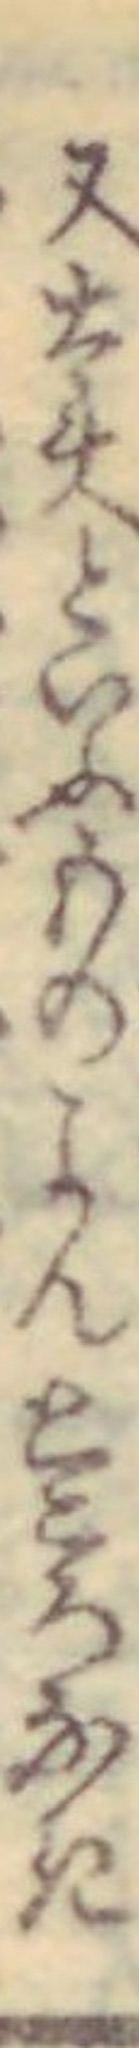又太夫といふものよんところなき
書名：八ツ目鱣因縁物語 3巻
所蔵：国立国会図書館 National Diet Library, JAPAN
